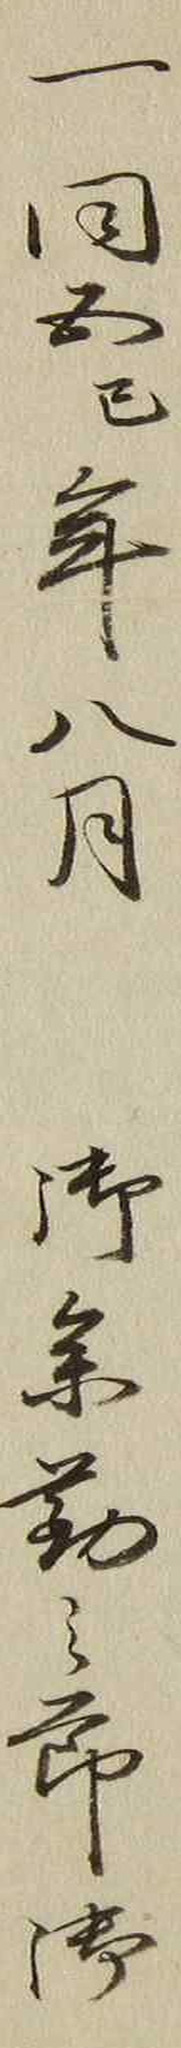一同五巳年八月御参勤之節御
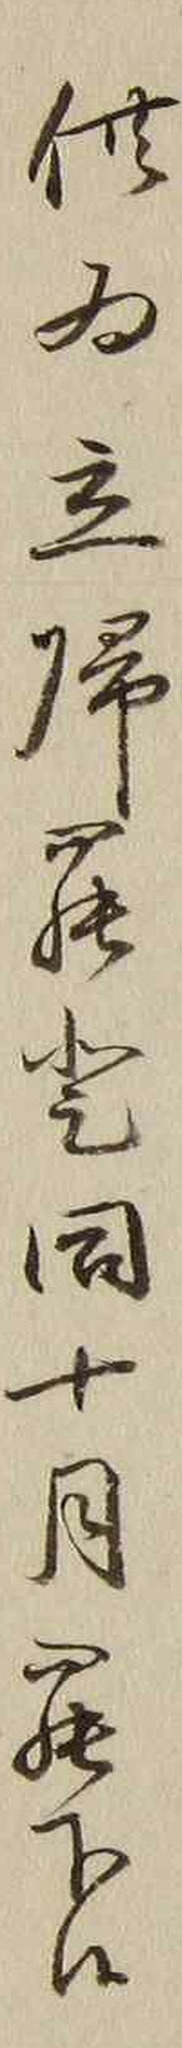供為立帰罷登同十月罷下候
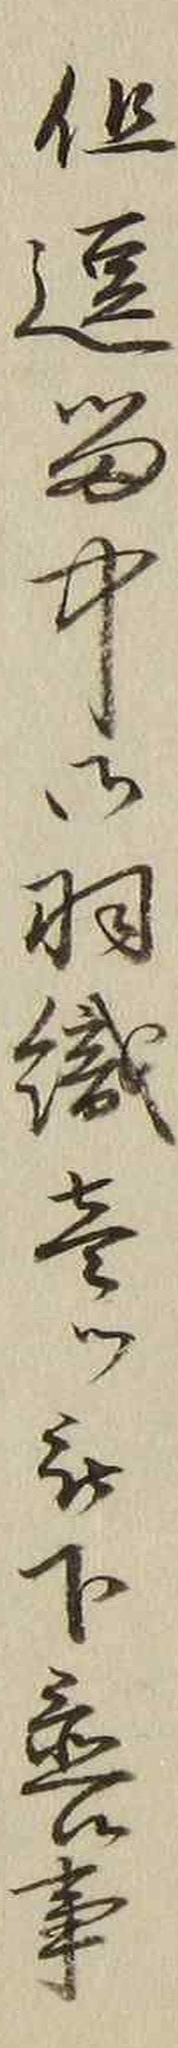但逗留中御羽織壱つ被下置候事
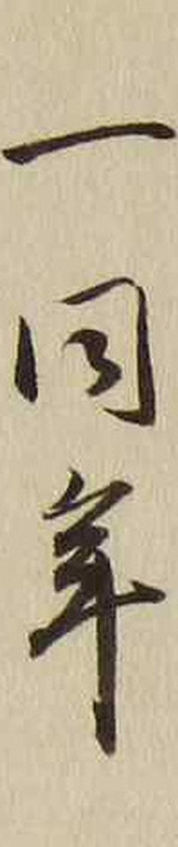一同年
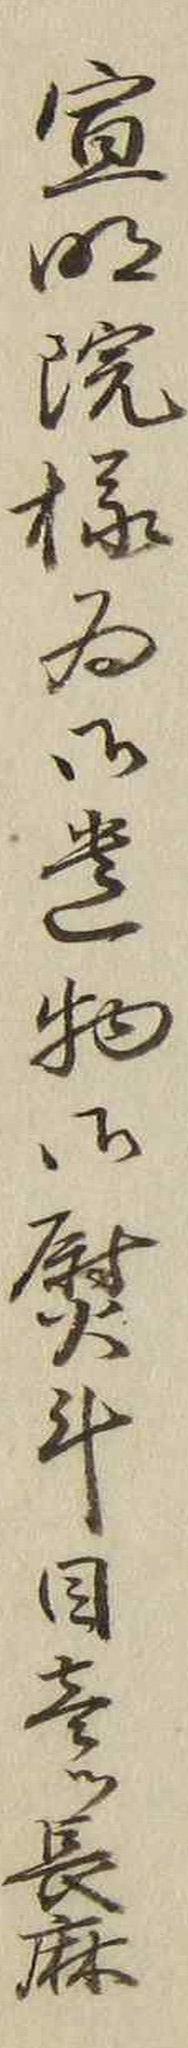宣明院様為御遺物御熨斗目壱つ長麻

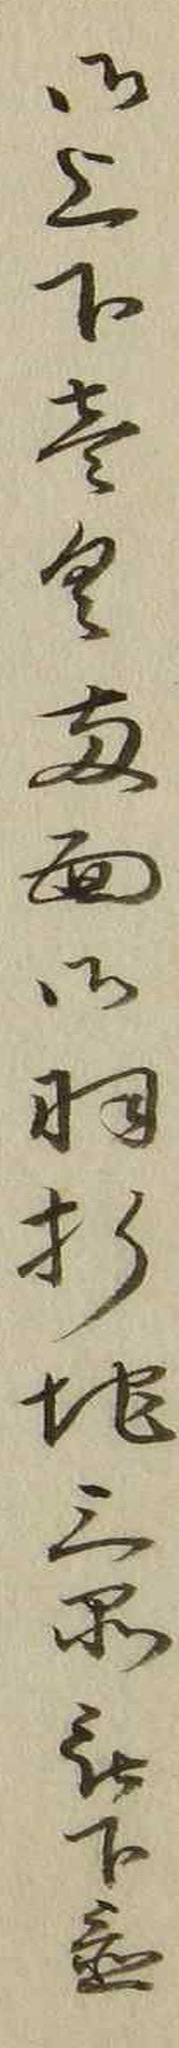御上下壱具両面御羽折地三品被下置
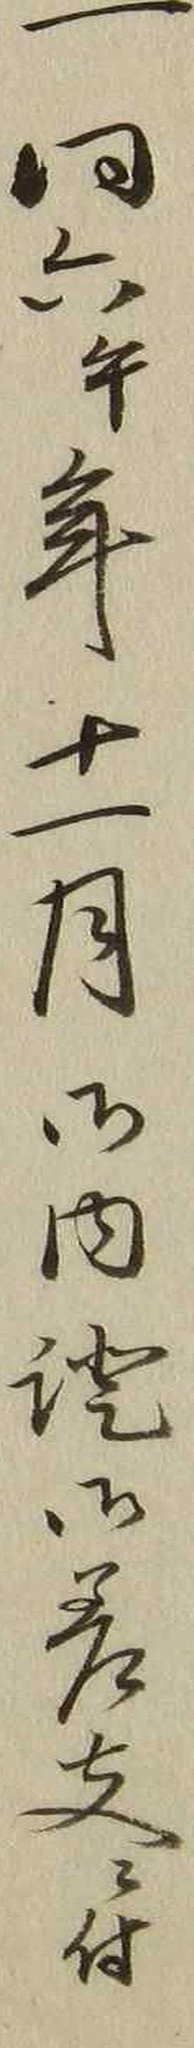一同六午年十一月御内証御差支に付
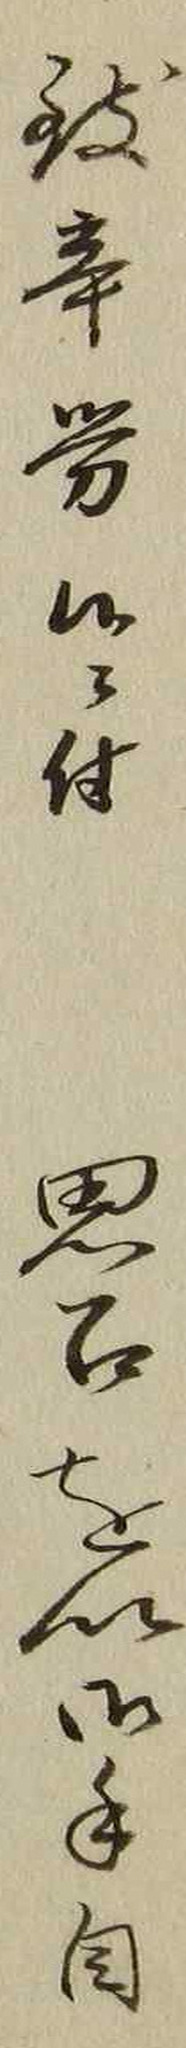致辛労候に付思召を以御手自
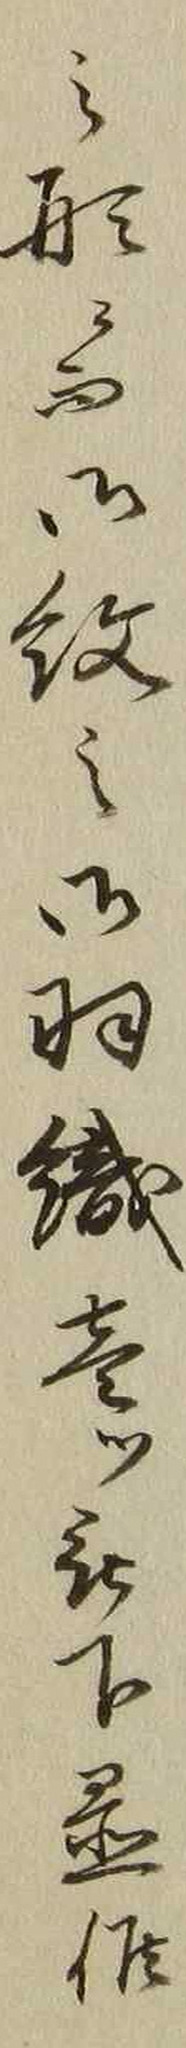之形に而御紋之御羽織壱つ被下置候
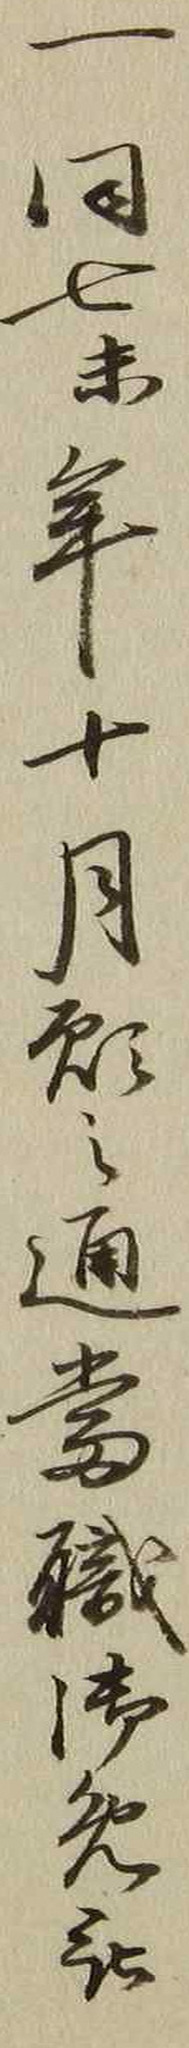一同七未年十月願之通当職御免被
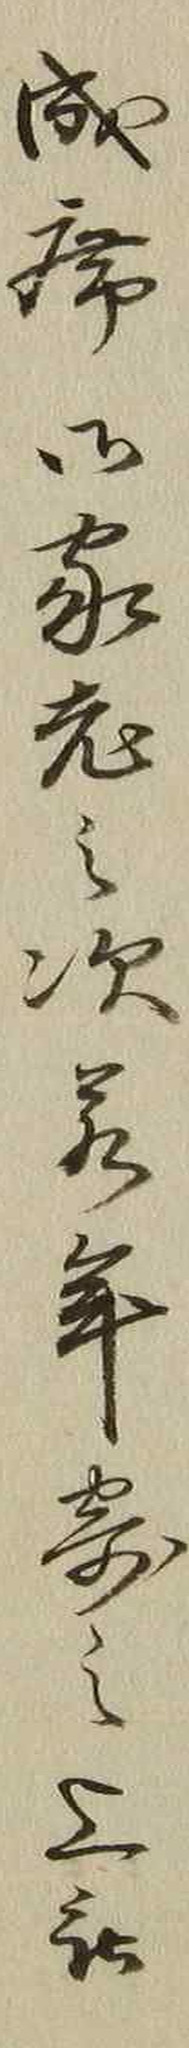成席御家老之次若年寄之上被
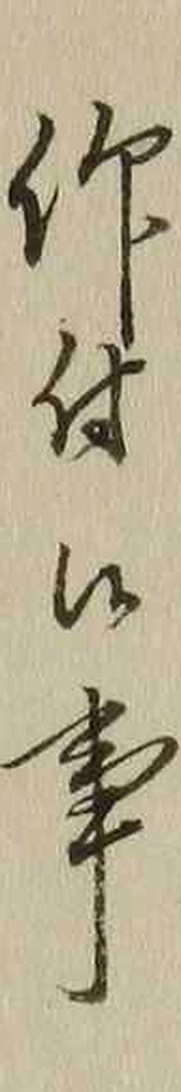仰付候事
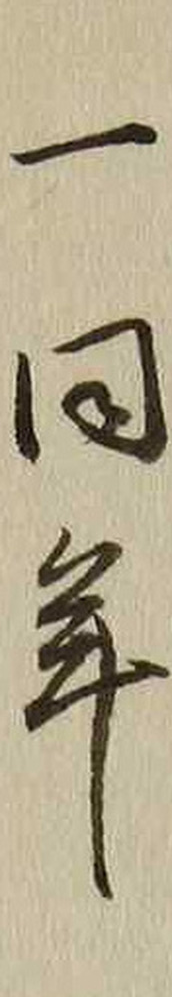一同年
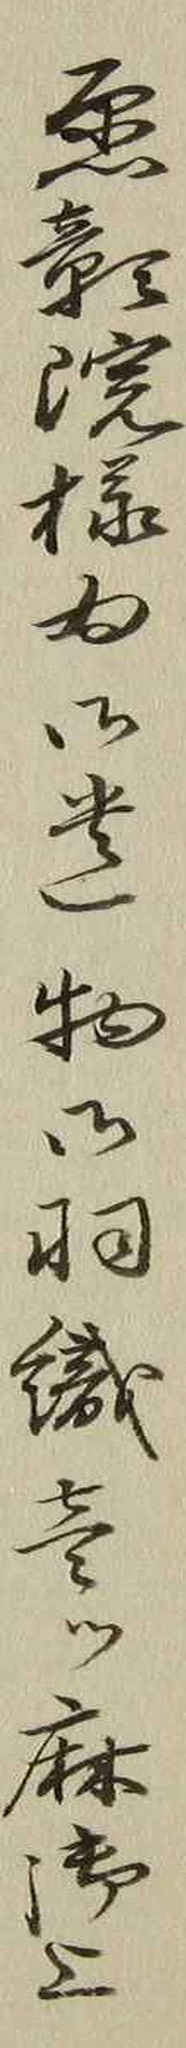愿彰院様為遺物御羽織壱つ御上
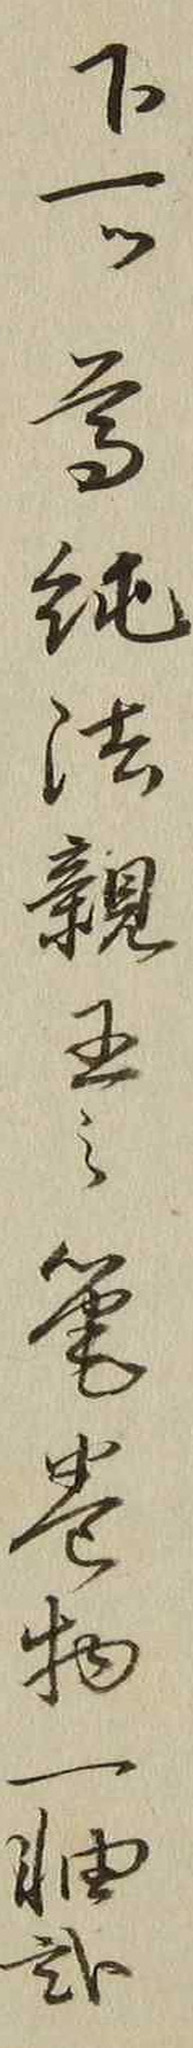下一尊純法親王之筆巻物一軸弐
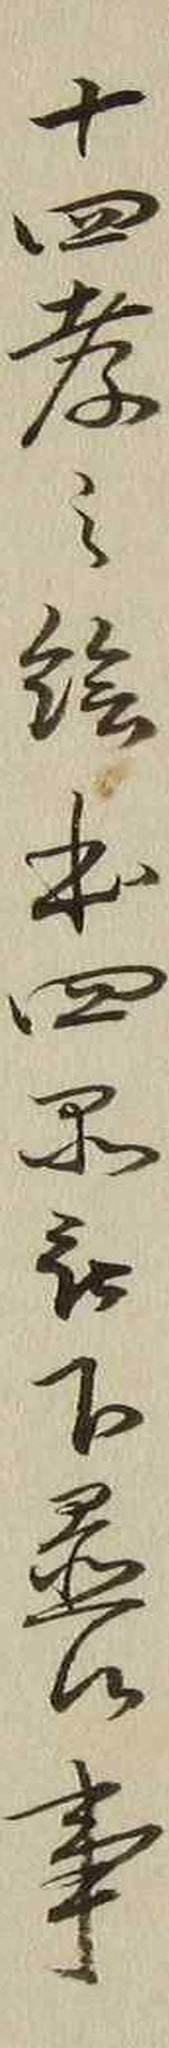十四孝之絵本四品被下置候事
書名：諸士系譜　巻之133　た之部9
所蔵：会津若松市立会津図書館
